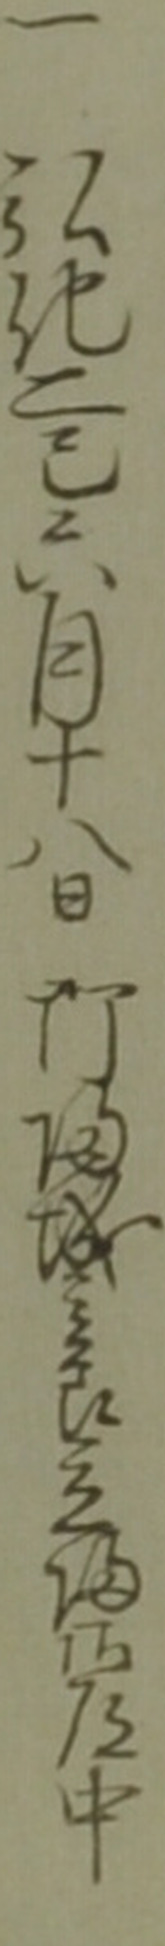一弘化二巳六月十八日御帰城之節立帰御道中
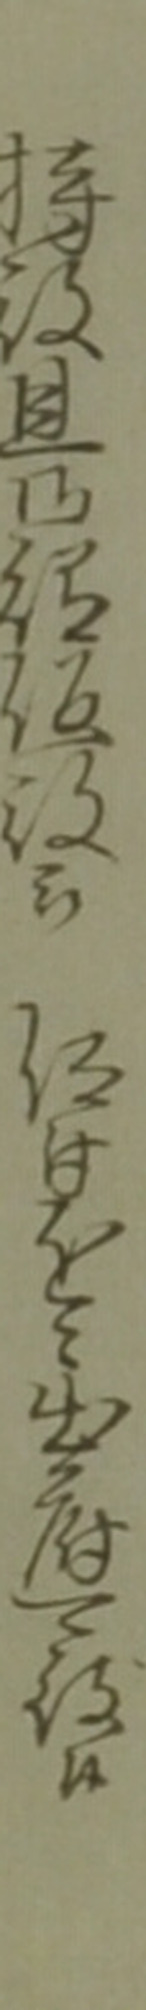持役且御賄仮役被仰付近々出府可致候
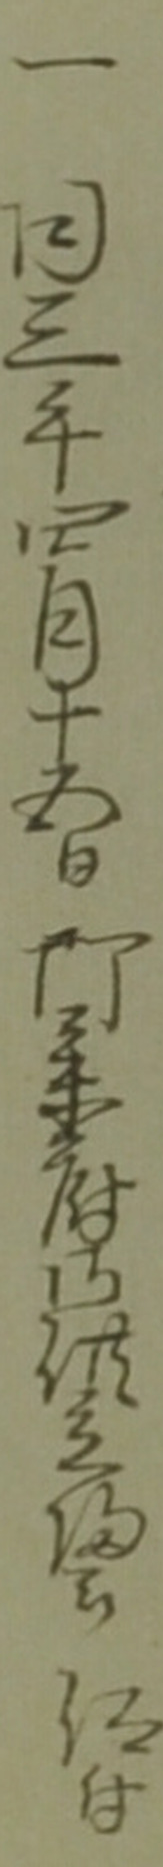一同三午四月十五日御参府御供立帰被仰付
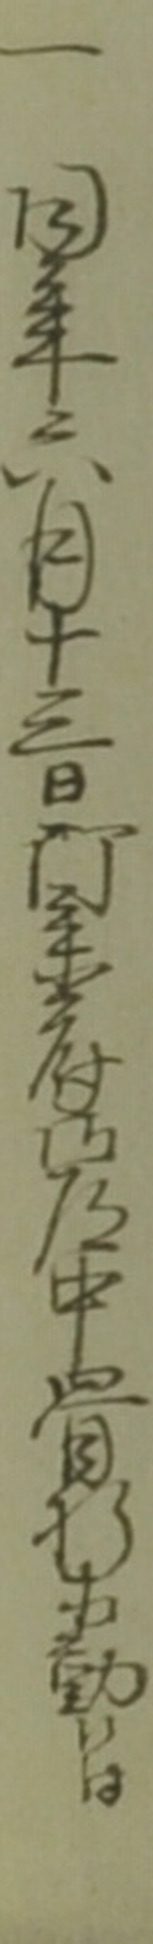一同年六月十三日御参府御道中骨折相勤候付
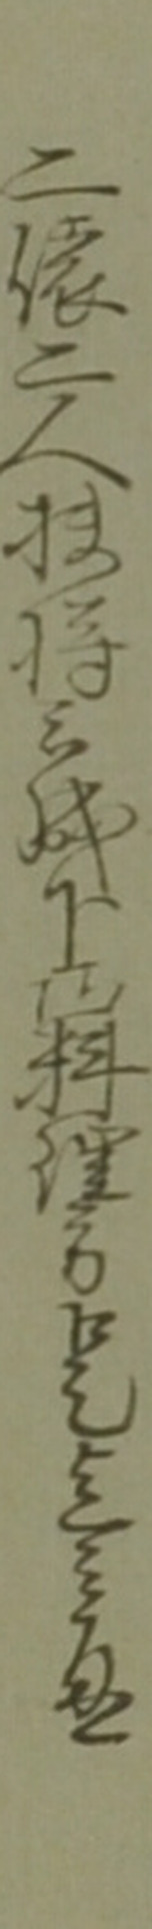二俵二人扶持被成下御料理方是迄之通
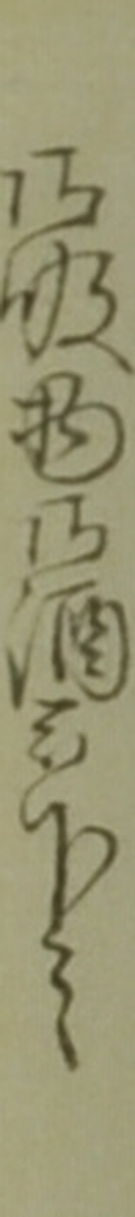御吸物御酒被下之

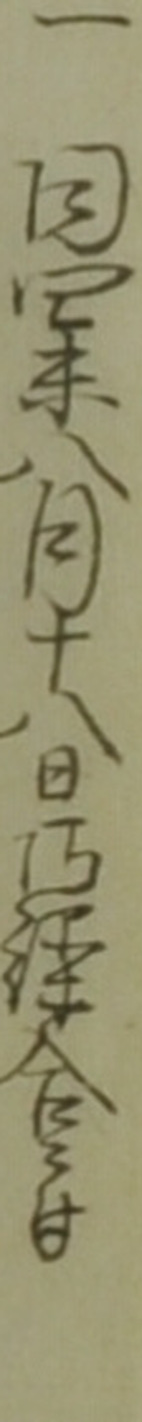一同四未八月十八日御繰合ニ付
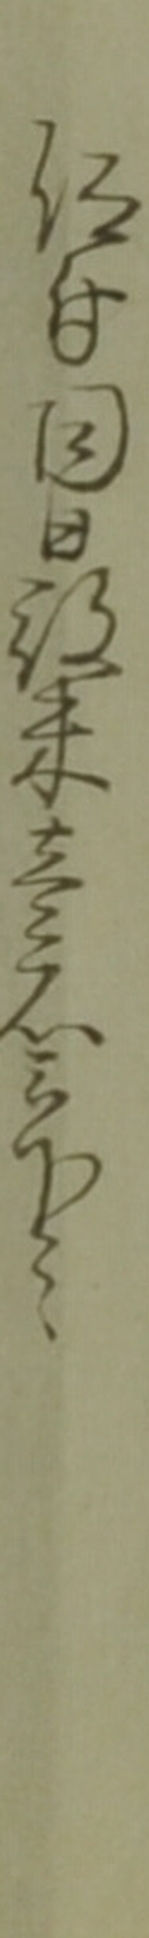仰付同日役米壱石被下之
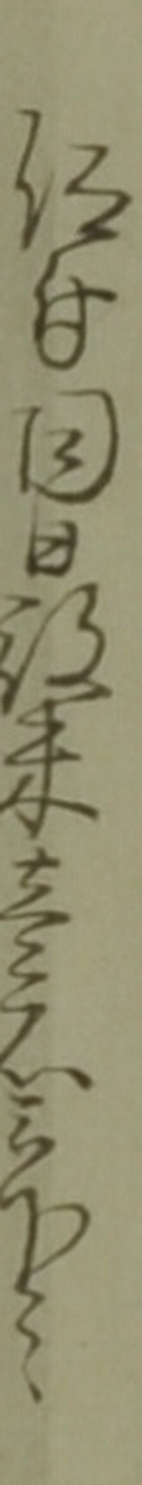仰付同日役米壱石被下之
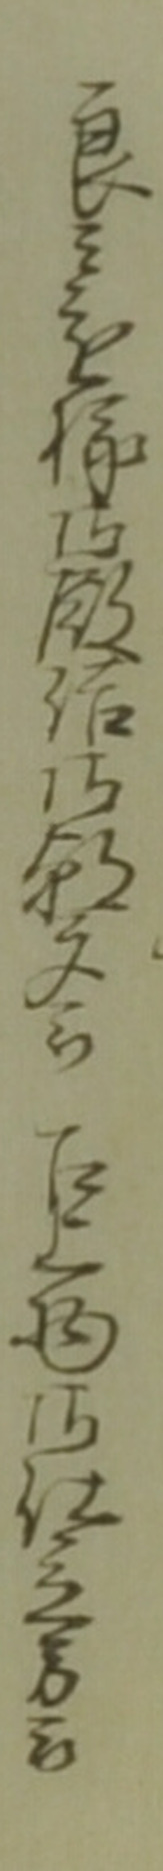良之進様御殿詰御朝夕被召上物御仕立方被

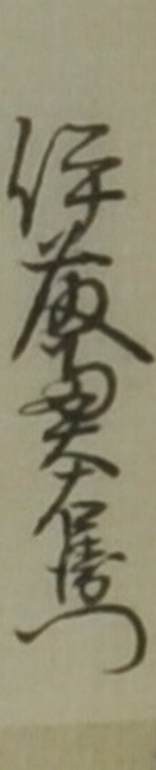伊藤奥右衛門
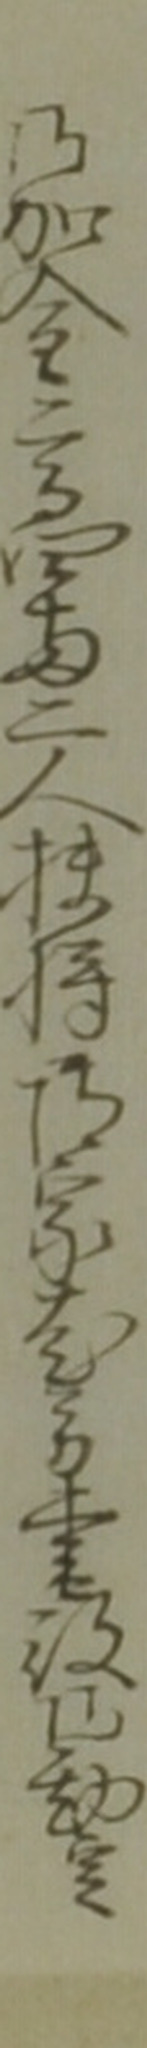御加金高四両二人扶持御家老方書役御勘定
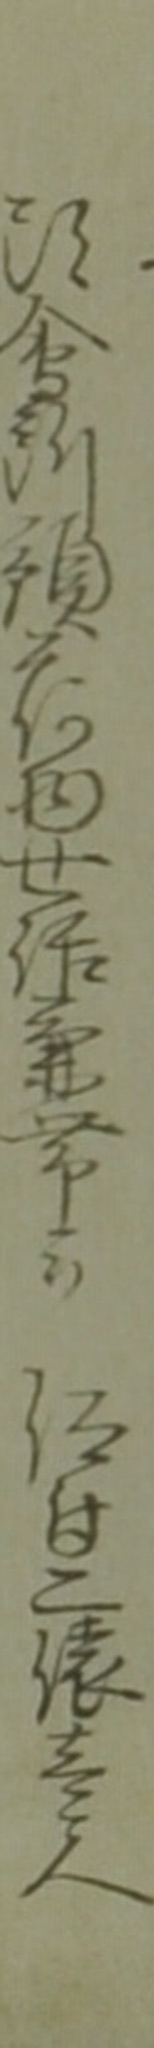頭会所預荷物世話兼帯被仰付二俵壱人

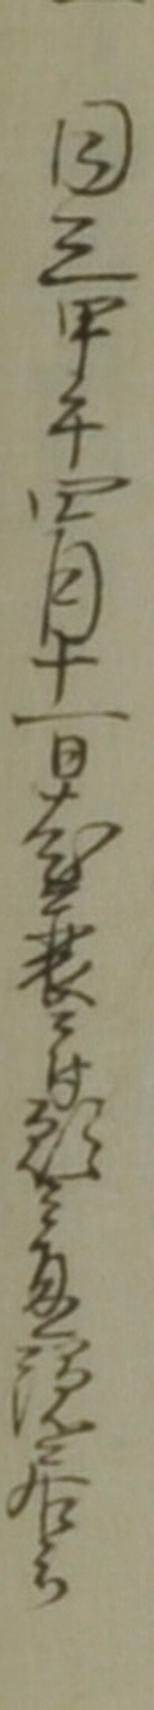一同三甲午四月十一日老衰ニ付願之通隠居被

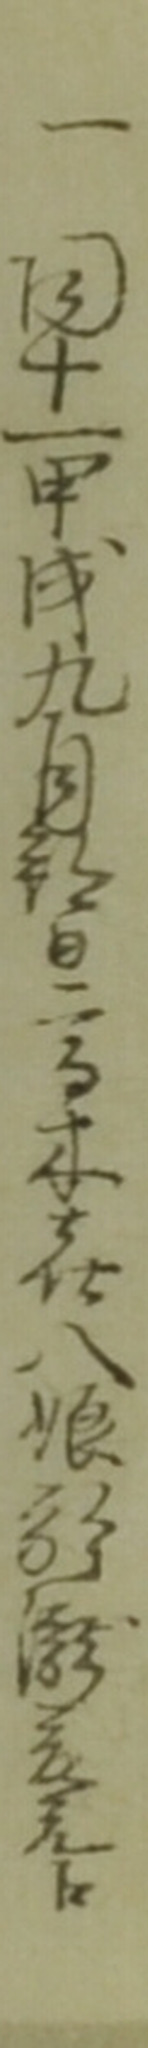一同十一甲戌九月朔日高木喜八娘於滝爰先江
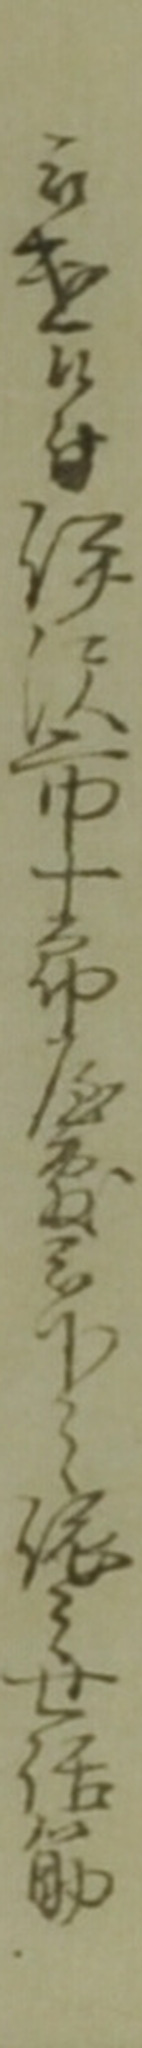被遣候付伊沢市十郎屋敷被下之依之世話筋
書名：無足諸士勤仕録（三）
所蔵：伊那市立高遠町図書館・合同会社AMANE
